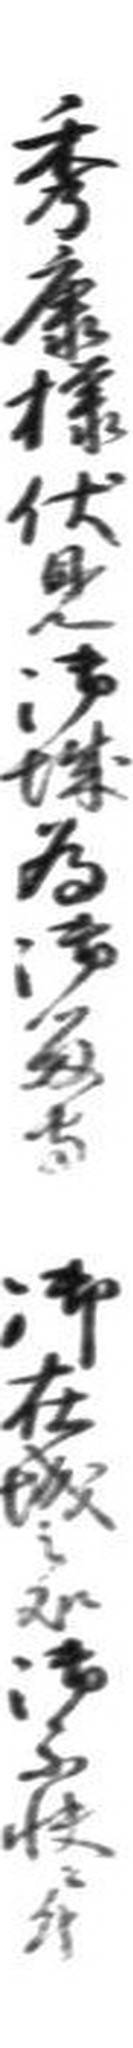秀康様伏見御城為御留守御在城之処御不快ニ付
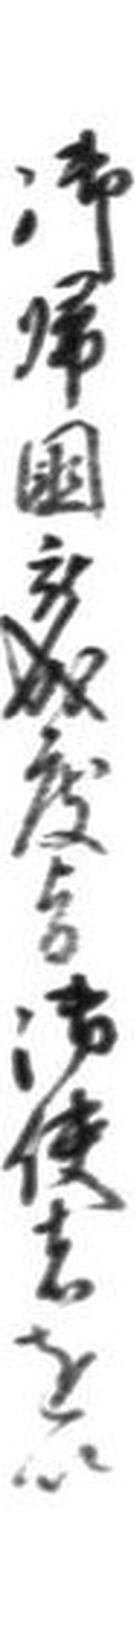御帰国被成度旨御使者を以
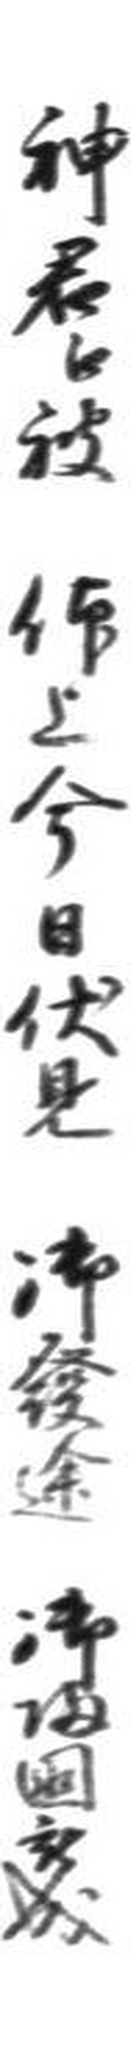神君江被仰上今日伏見御発途御帰国被成
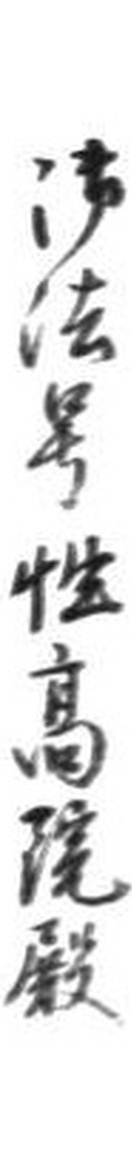御法号性高院殿
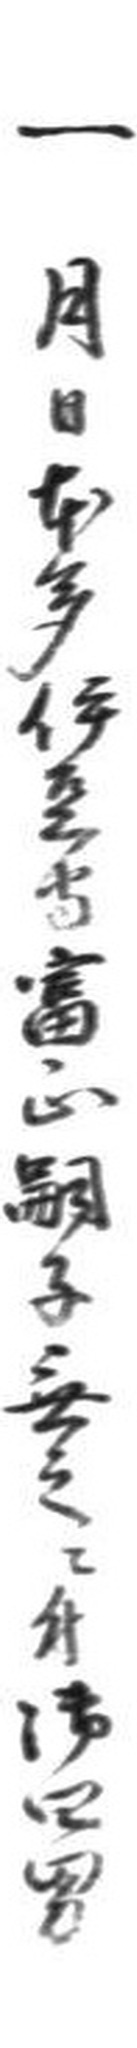一月日本多伊豆守富正嗣子無之ニ付御四男
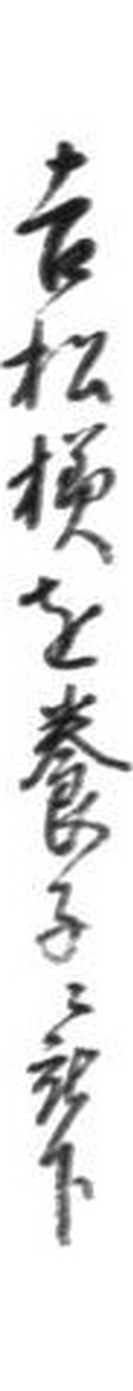吉松様を養子二被下
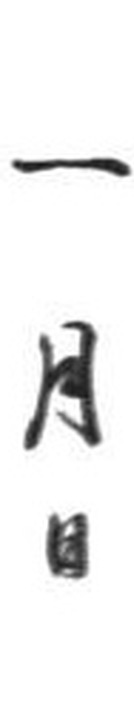一月日

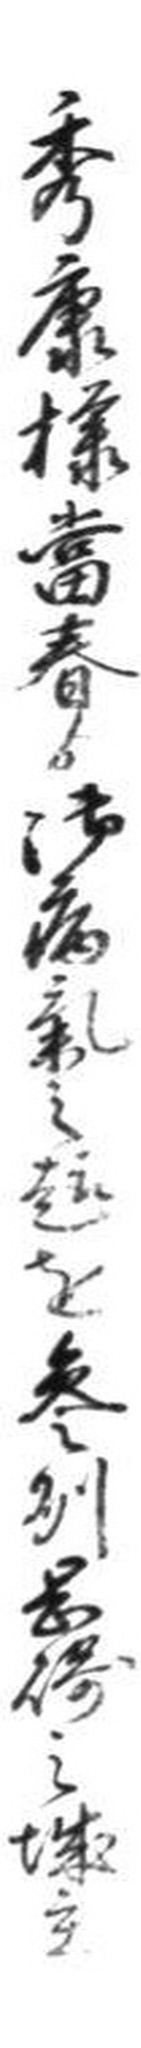秀康様当春ゟ御病気之趣を参州岡崎之城主
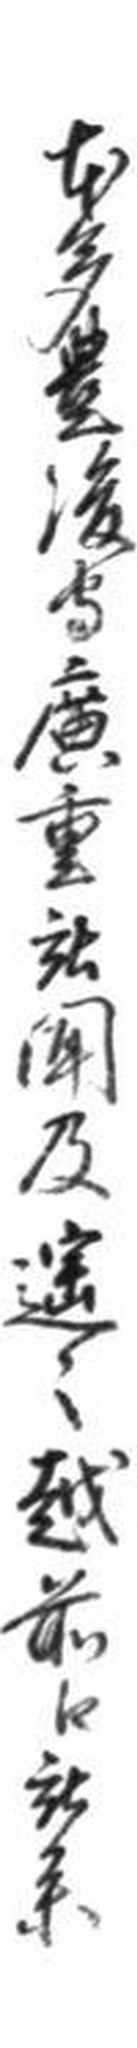本多豊後守広重被聞及遥々越前江被参
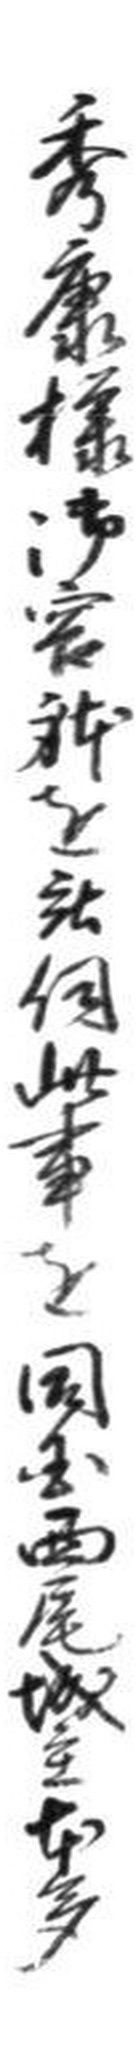秀康様御容体を被伺此事を同国西尾城主本多
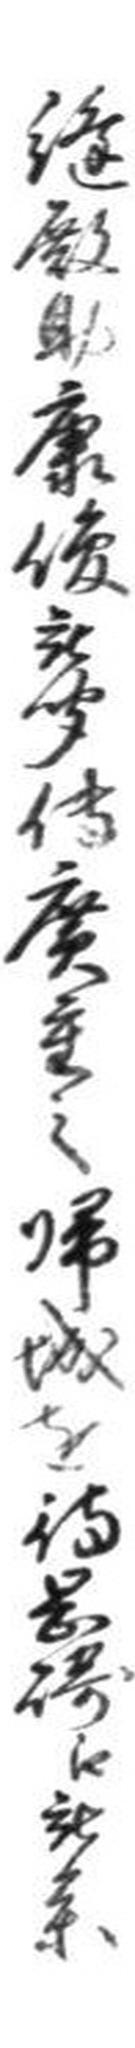縫殿助康俊被聞伝広重之帰城を待岡崎江被参
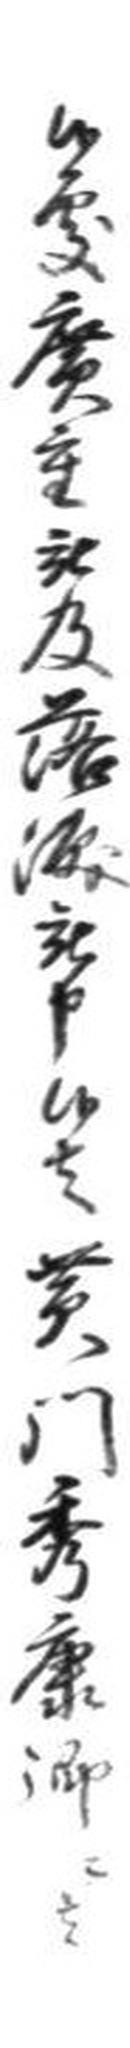候処広重被及落涙被申候者黄門秀康卿ニ者
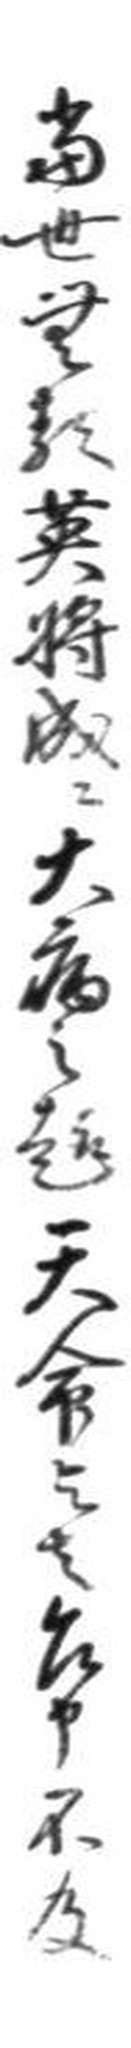当世無類英将成ニ大病之趣天命と者乍申不及
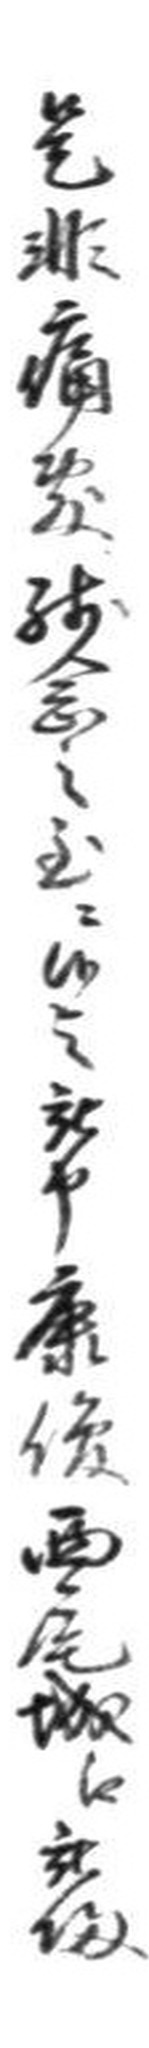是非痛敷残念之至ニ候と被申康俊西尾城江被帰
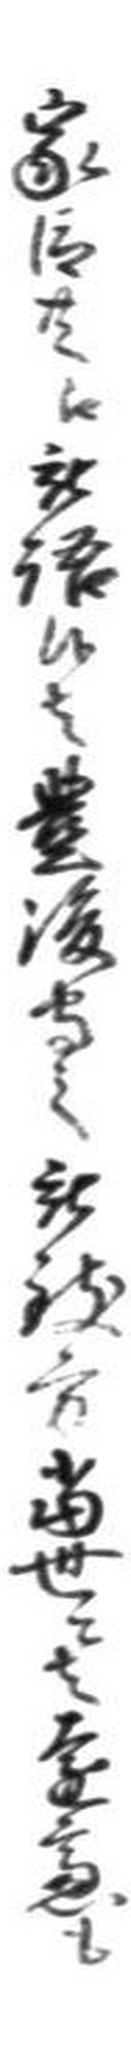家臣共江被語候者豊後守之被致方当世ニ者遠慮も
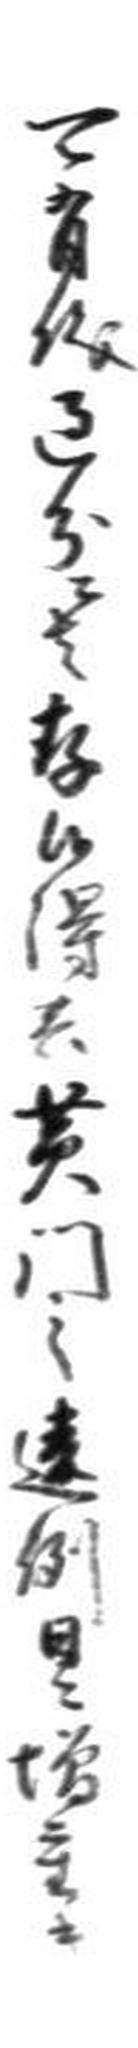可有儀過分ニ者存候得共黄門之違例日々増重キ
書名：家譜 一 秀康公 従天正二年到慶長十二年
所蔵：福井県文書館 Fukui Prefectural Archives
